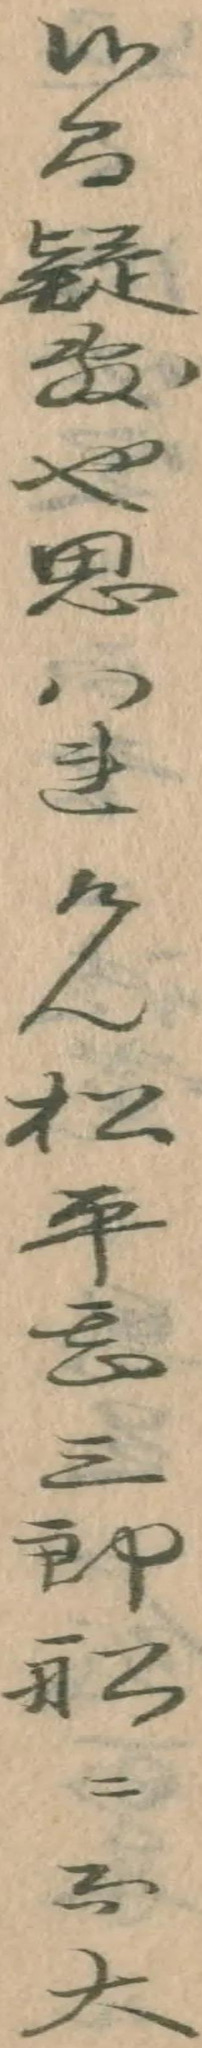候間疑敷也思はれけん松平甚三郎船に而大
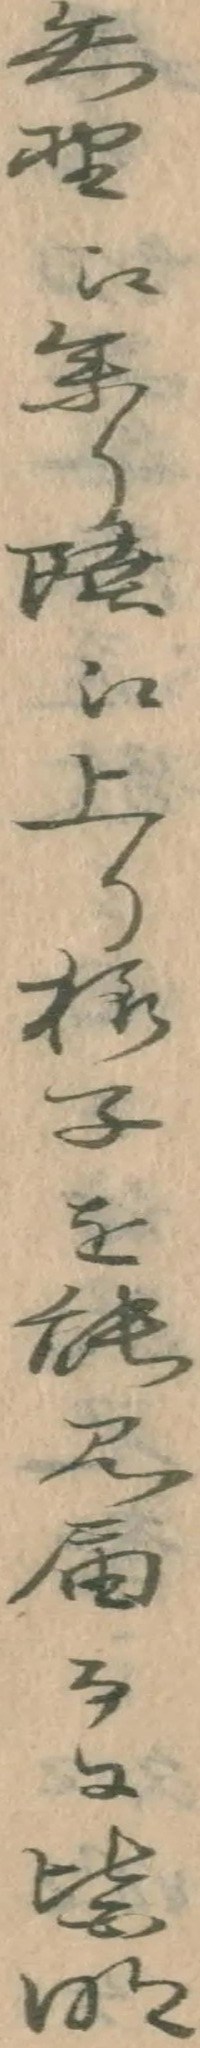矢野江参り陸江上り様子を能見届るに皆明
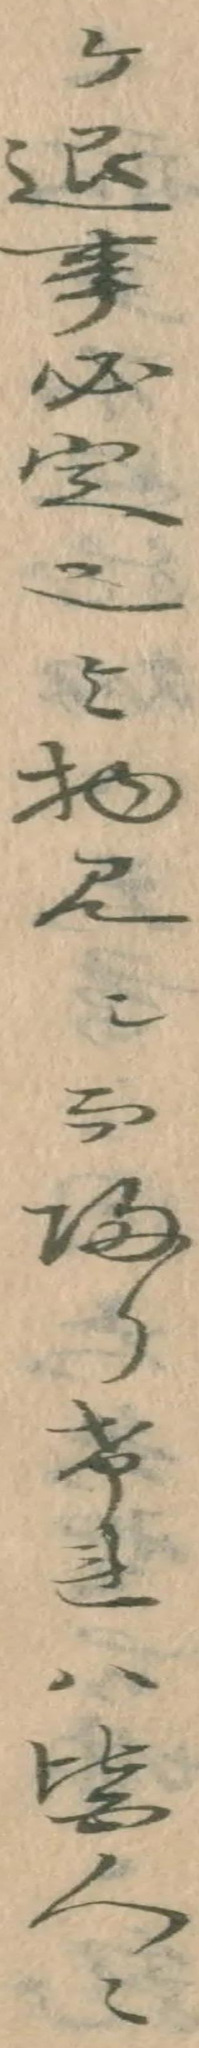け退事必定也と物見し而帰りけれは皆人々
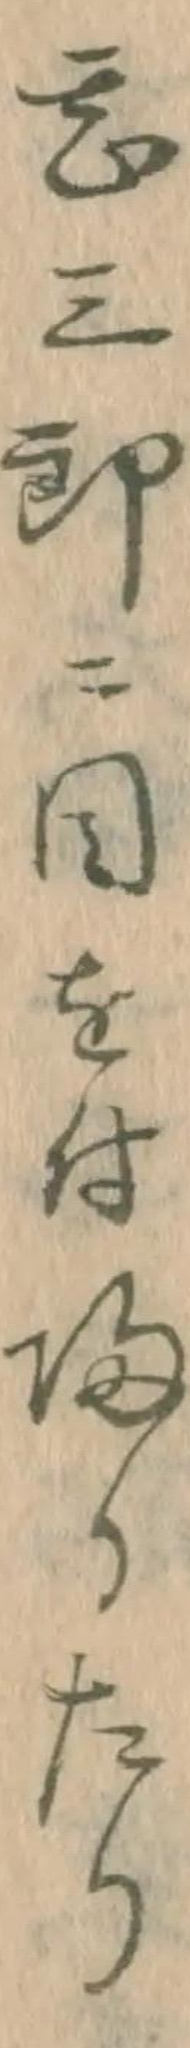甚三郎に目を付帰りたり
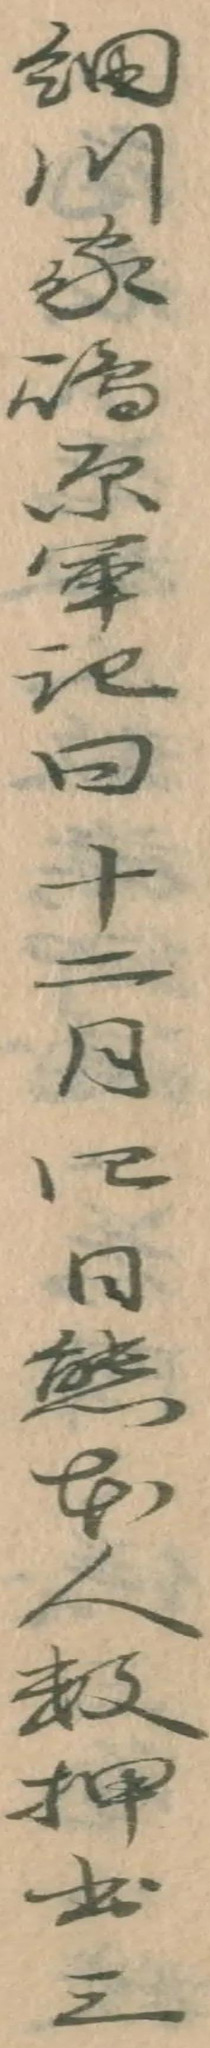細川家島原軍記曰十二月四日熊本人数押出三

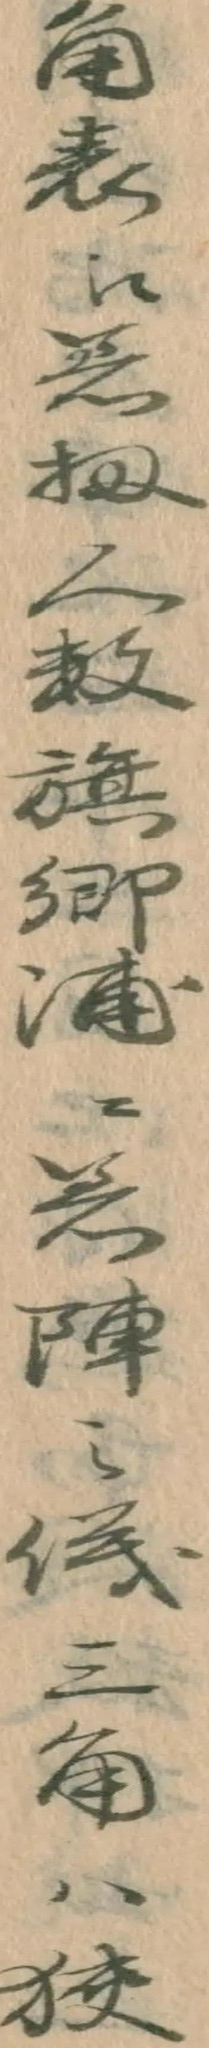角表江着扨人数旗郷浦に着陣之儀三角は狭
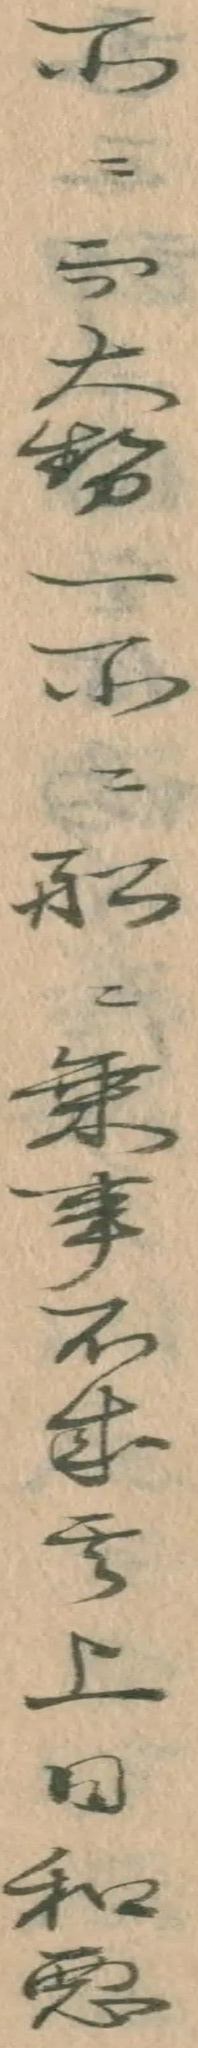所に而大勢一所に船に乗事不成其上日和悪
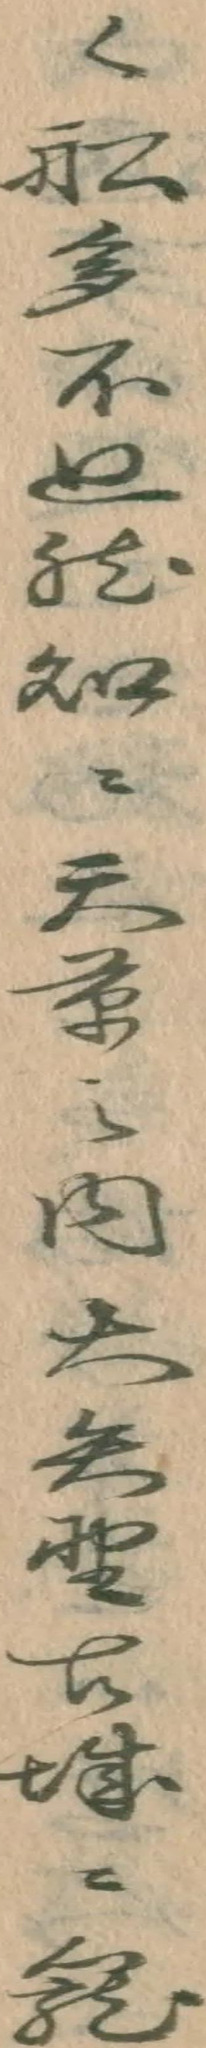く船多不廻然処に天草之内大矢野古城に籠
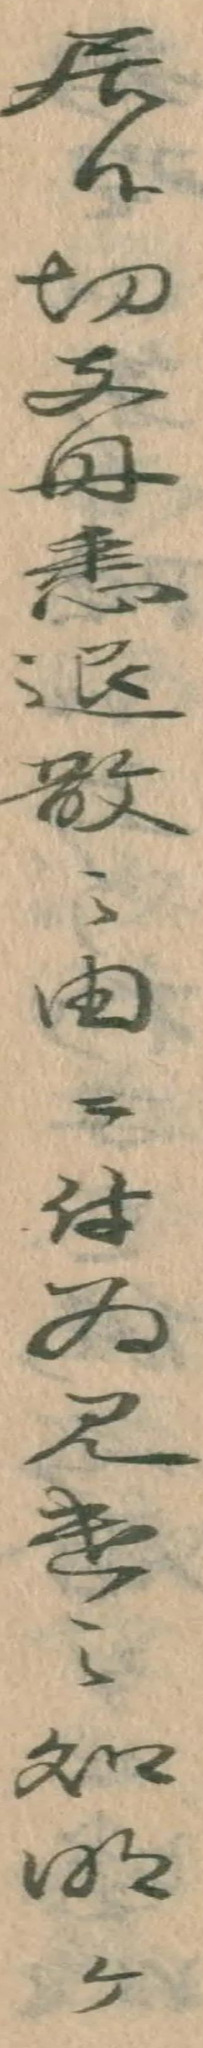居候切支丹悉退散之由に付為見遣之処明け
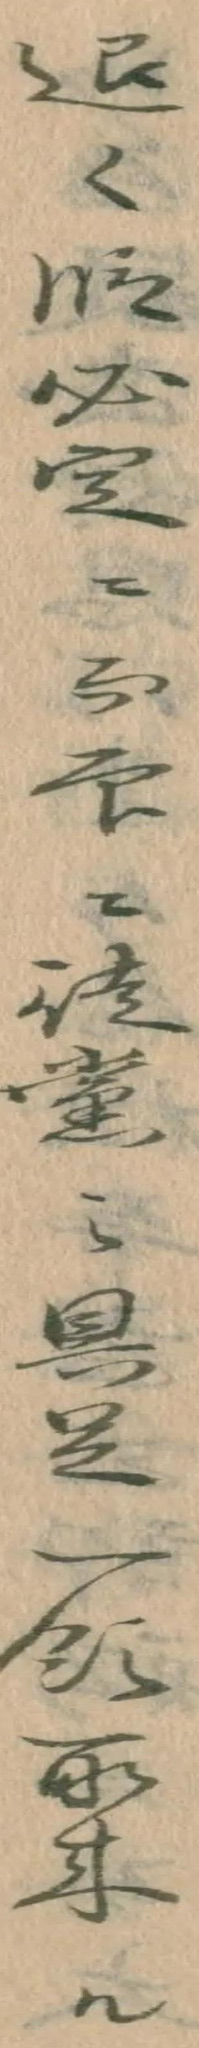退く段必定に而印に徒党之具足一領取来る
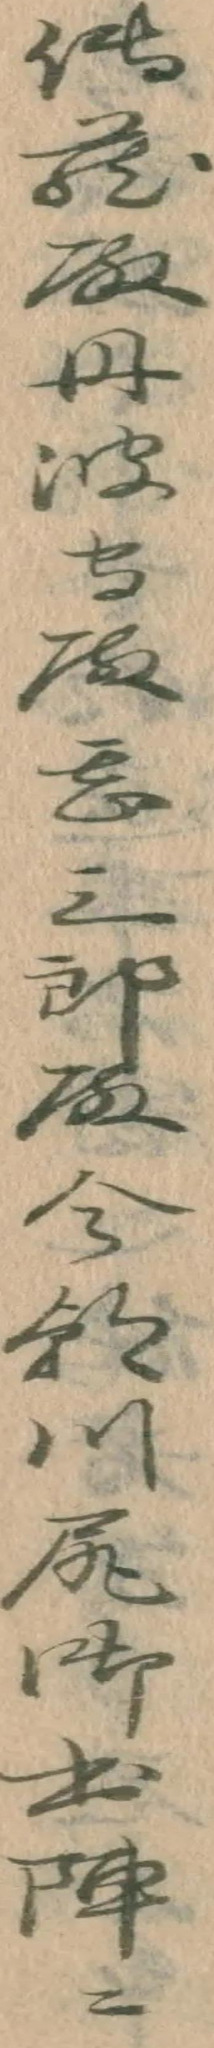伝蔵殿丹波守殿甚三郎殿今朝川尻御出陣に
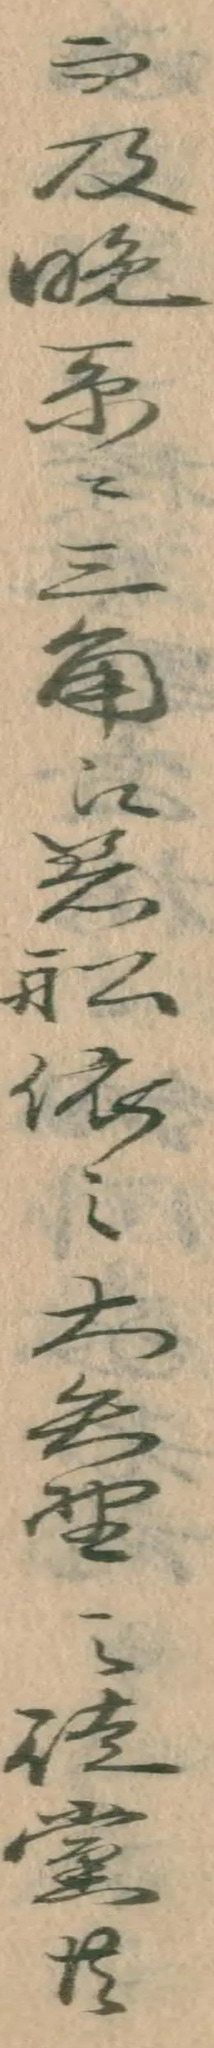而及晩景に三角江着船依之大矢野之徒党共
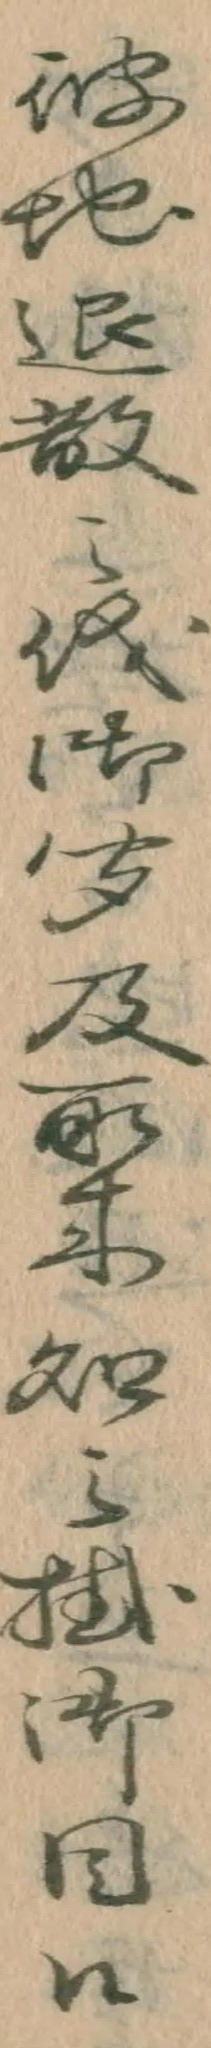彼地退散之儀御聞及取来処之掛御目候
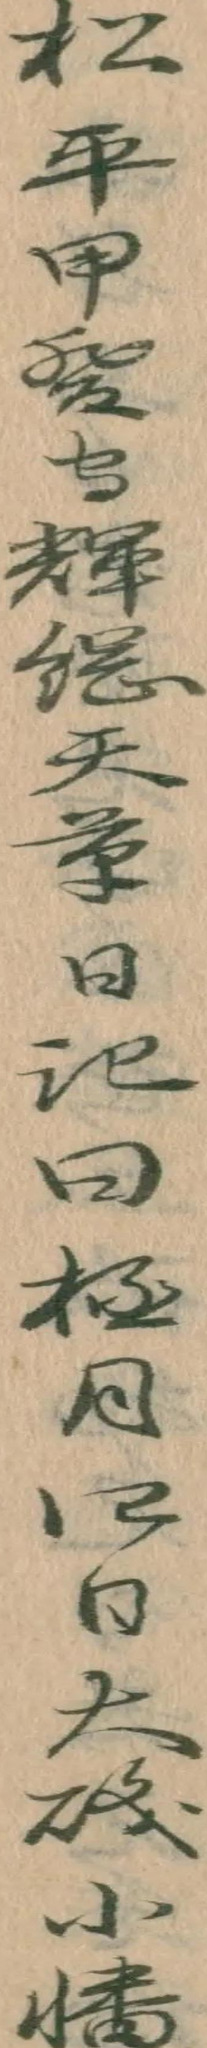松平甲斐守輝綱天草日記曰極月四日大礒小幡
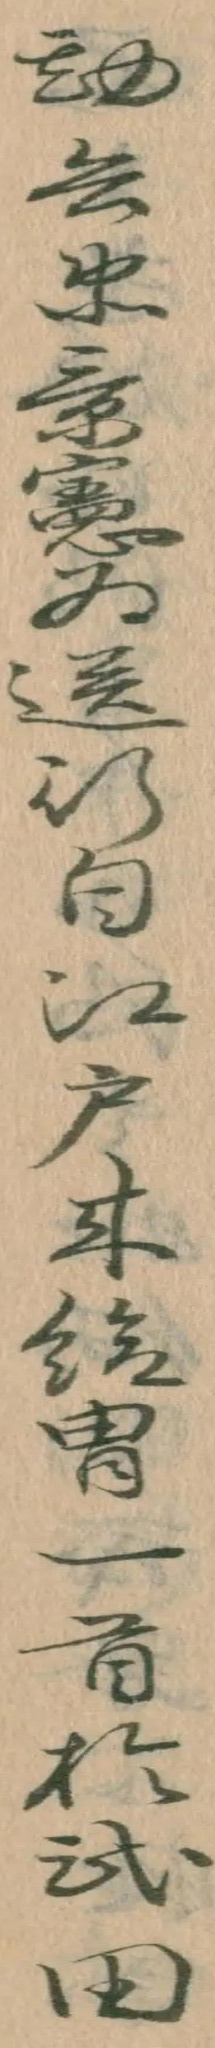勘兵衛景憲為送行自江戸来給冑一首於武田
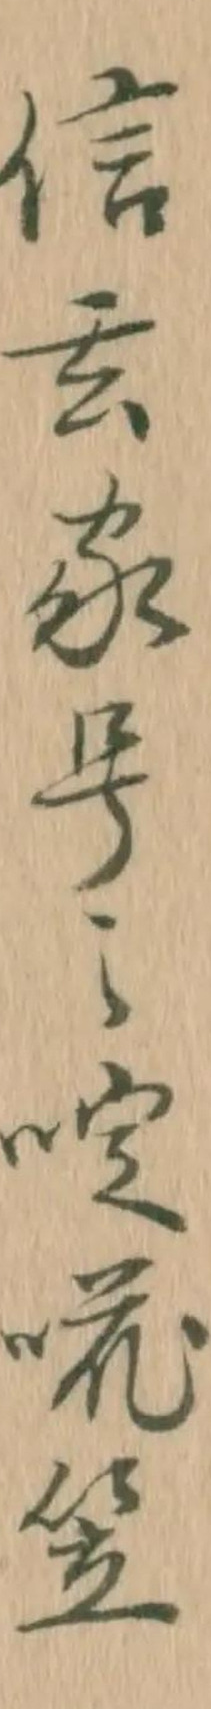信玄家号之喧嘩笠
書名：切支丹御退治記 49巻. [3]
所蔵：国立国会図書館 National Diet Library, JAPAN
